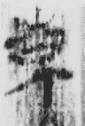東
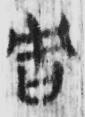周
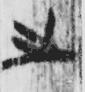之
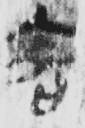客
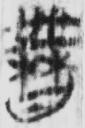○（許）
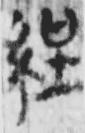○（盈）
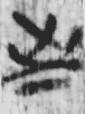至（致）
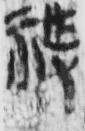祚（胙）
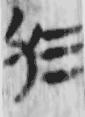於
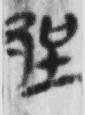郢
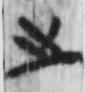之
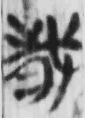歲（歲）
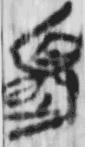○（夏）
